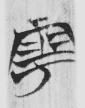𩁹
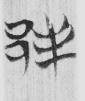邦
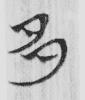多
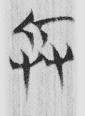兵
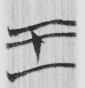王
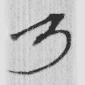乃
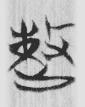敕
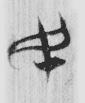民
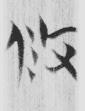攸
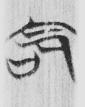命
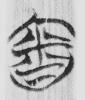{宀米甘}
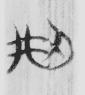{井刀}
